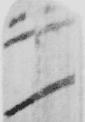王
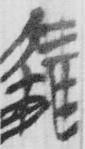{尒䎽}（問）
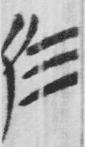於
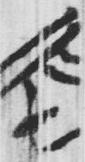帀（師）
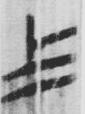上（尚）
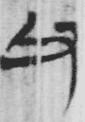父
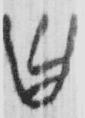曰
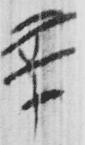不
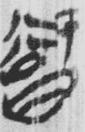智（知）
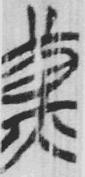黃
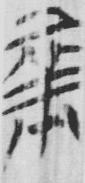帝
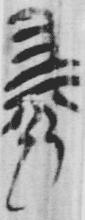耑（顓）
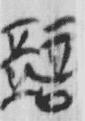琂（顼）
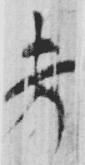堯
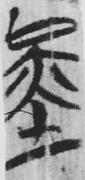○（舜）
